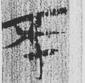不
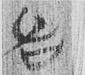左
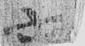才（哉）
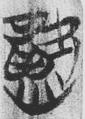{辛𦥑欠臼}（噬）
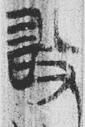敢
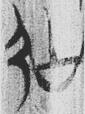居
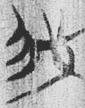我
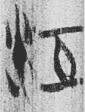江
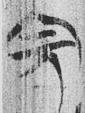○（濱）
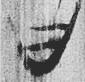曰
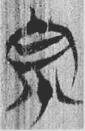余
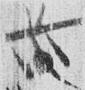必
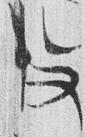攼
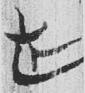芒
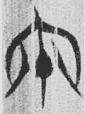尔（爾）
